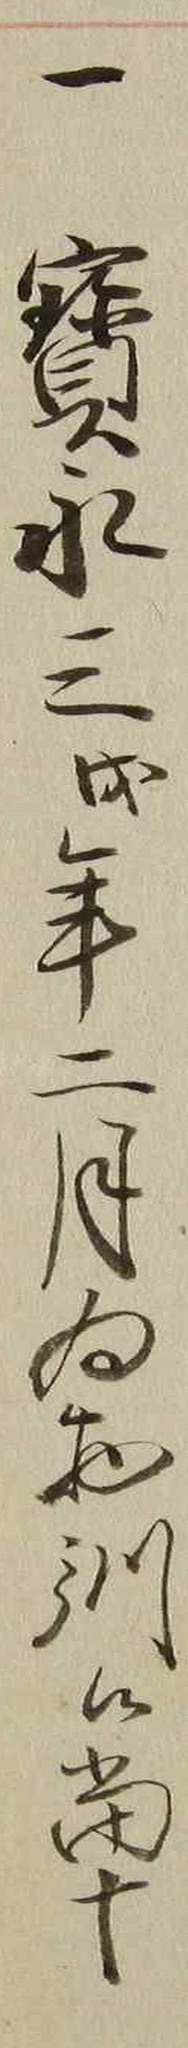一宝永三戌年二月為物馴候当十
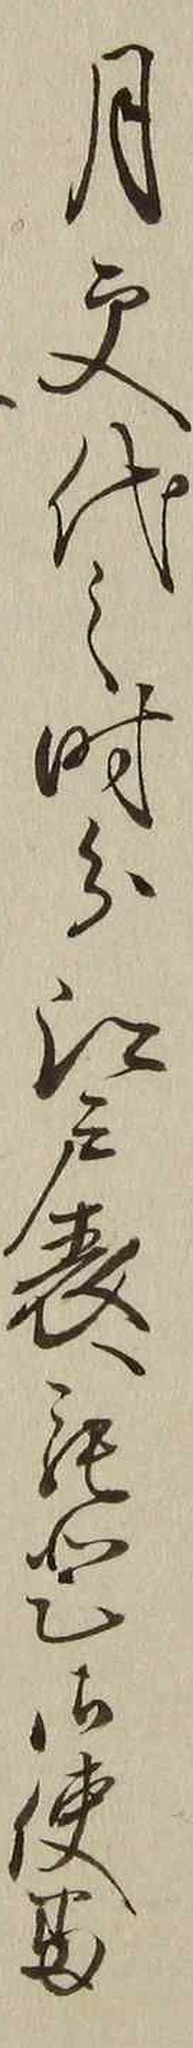月更代之時分江戸表へ罷登御使番
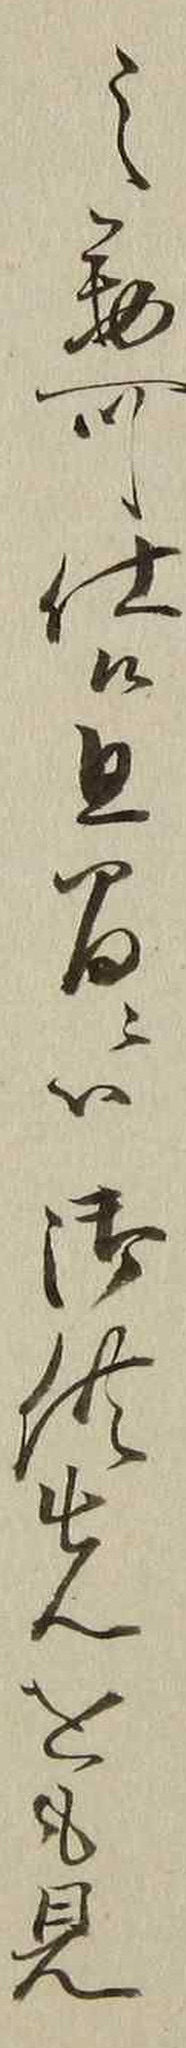之勤可仕侯且間には御供先をも見
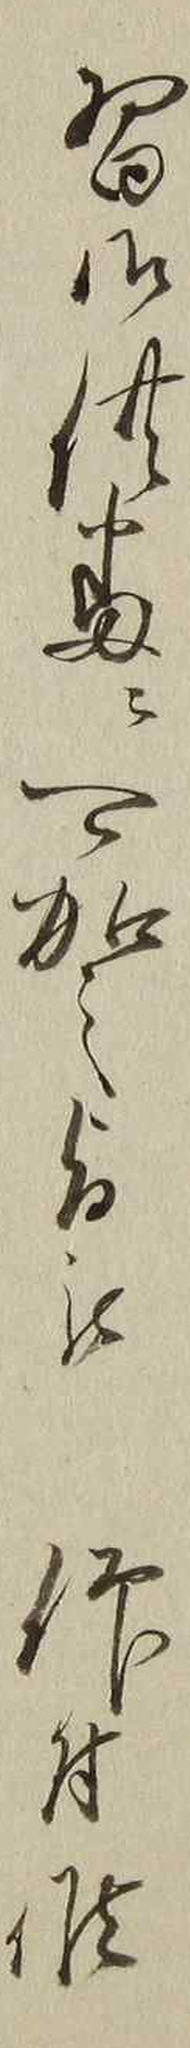習御供番に可加之旨被仰付候
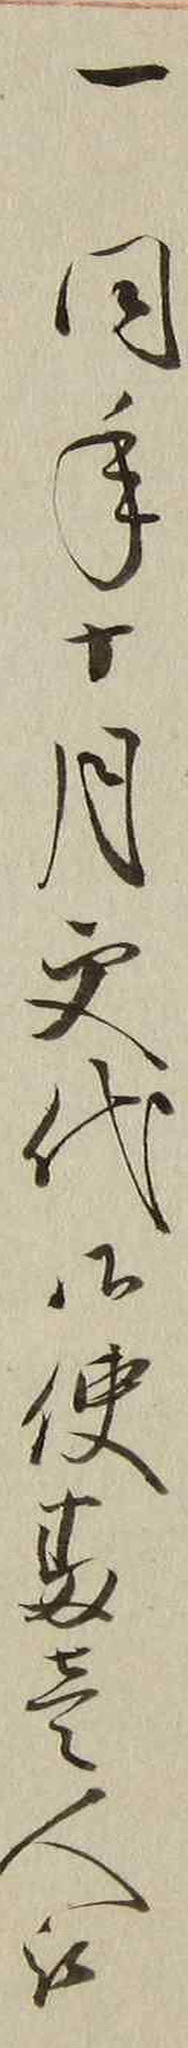一同年十月更代御使番壱人被
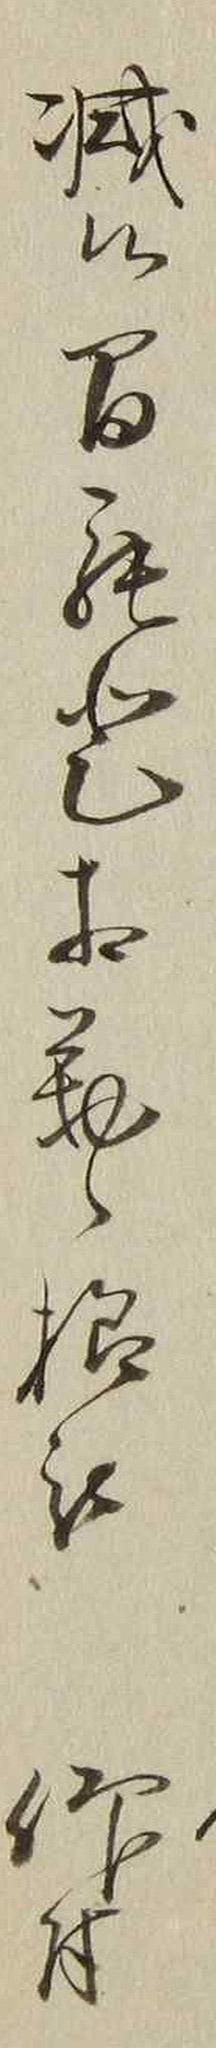減候間罷登相勤候様被仰付
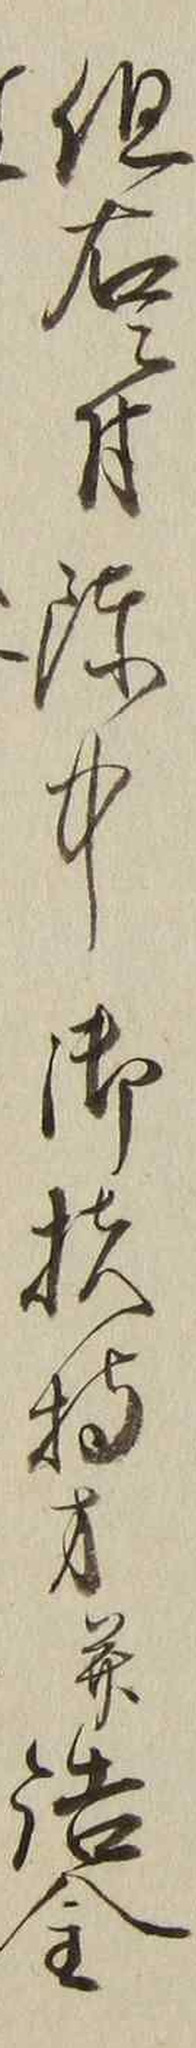但右に付陣中御扶持方并詰金
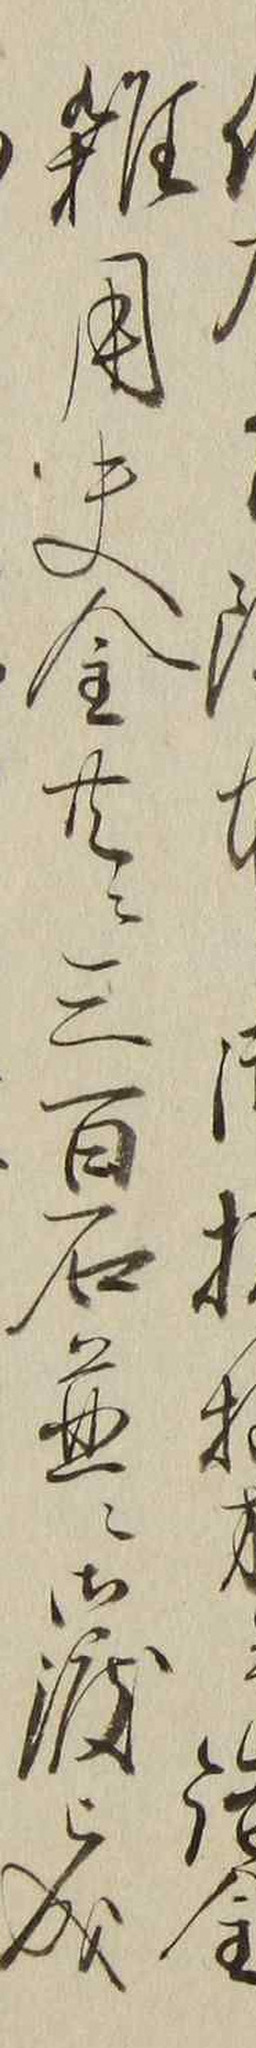雑用夫金共に三百石並に御渡被成
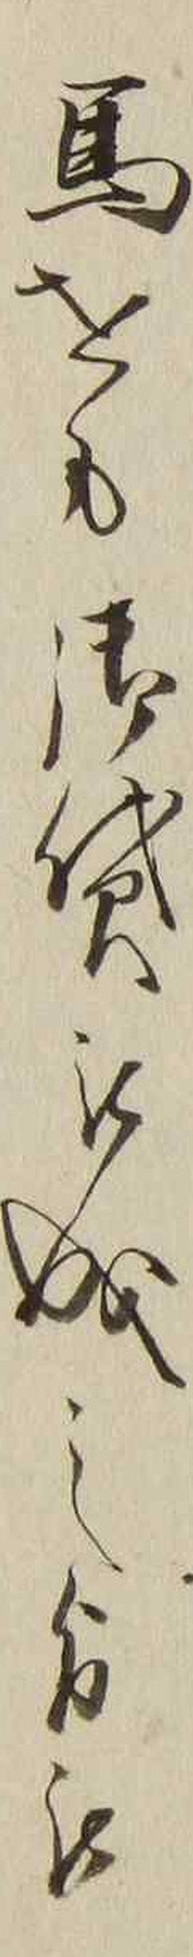馬をも御貸被成之旨被

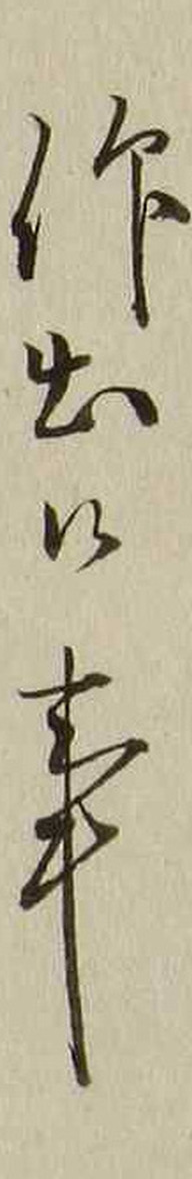仰出候事
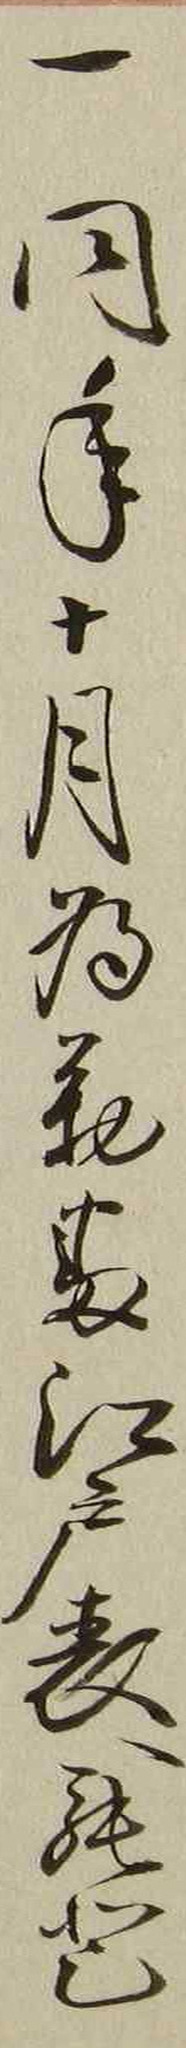一同年十月為勤番江戸表へ罷登
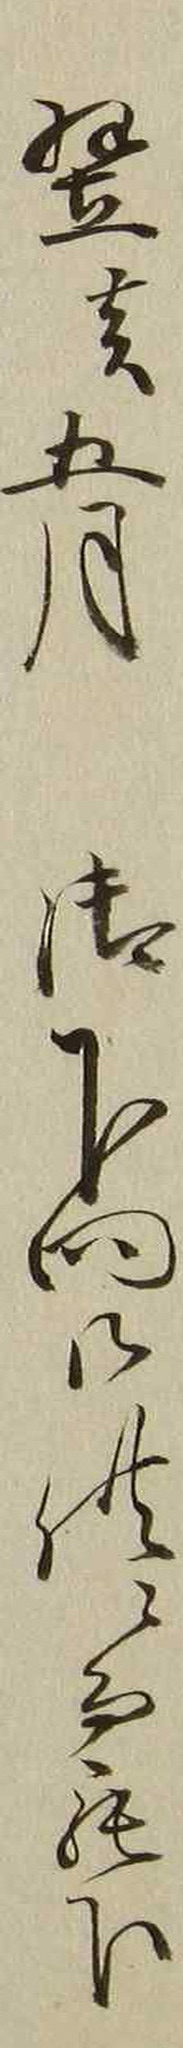翌亥五月御下向御供に而罷下
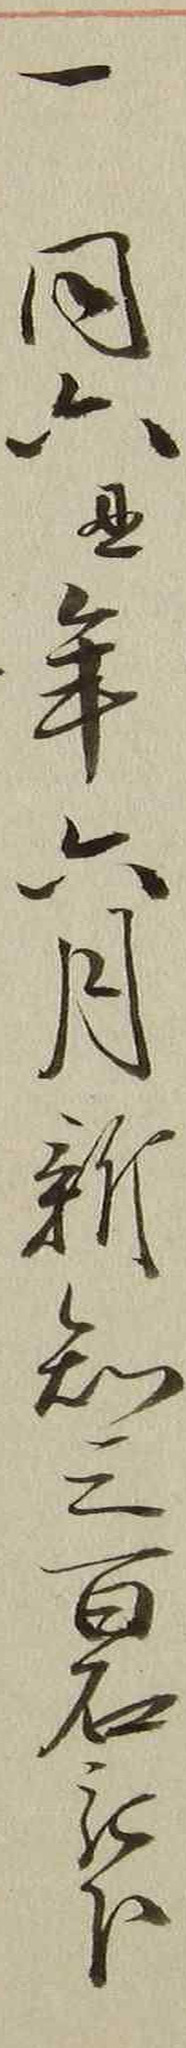一同六丑年六月新知三百石被下
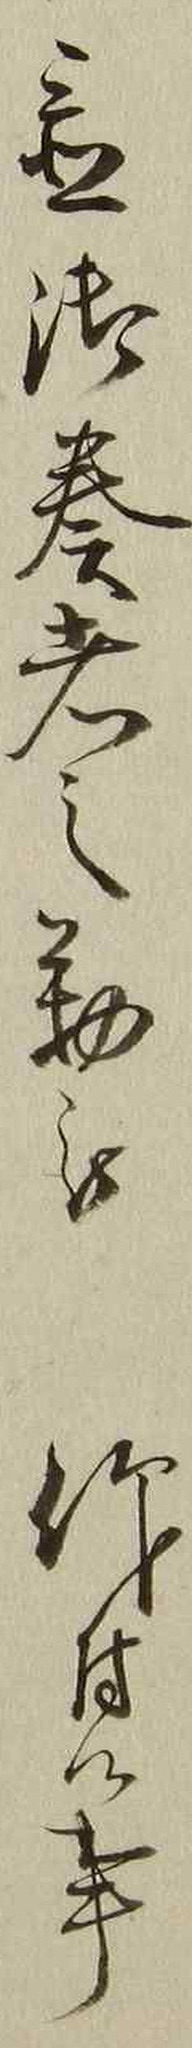置御奏者之勤被仰付候事
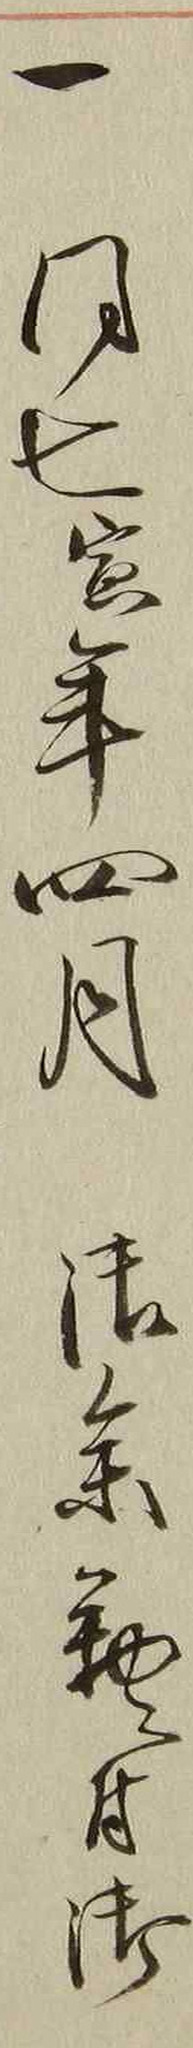一同七寅年四月御参勤に付御
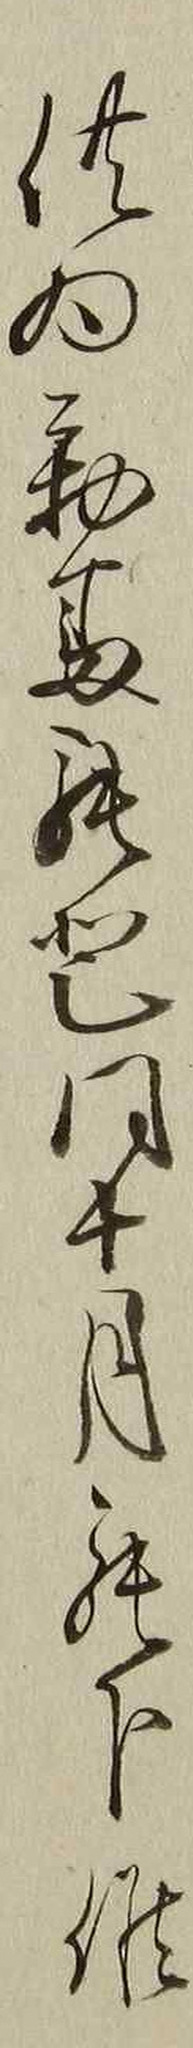供為勤番罷登同十月罷下候
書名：諸士系譜　巻之103　か之部11
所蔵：会津若松市立会津図書館
